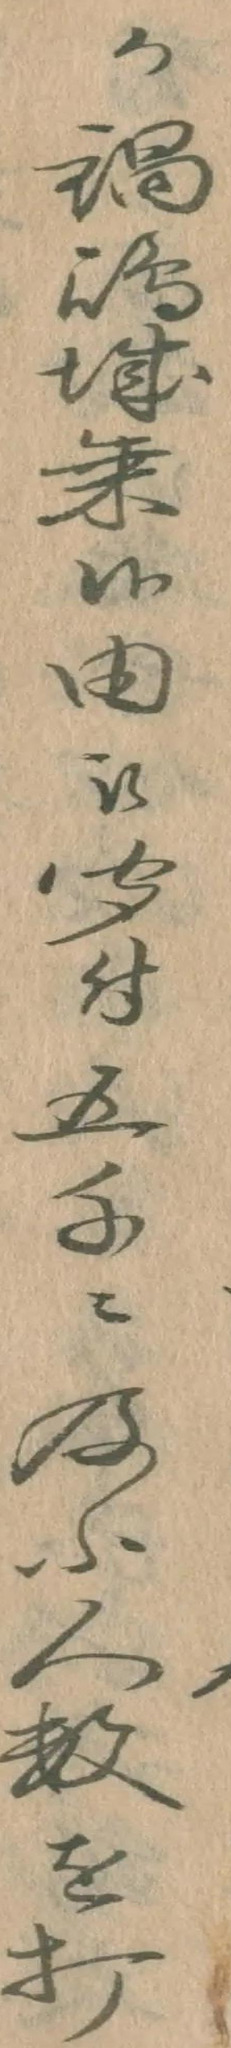か鍋島城乗候由被聞付五千に及ふ人数を打
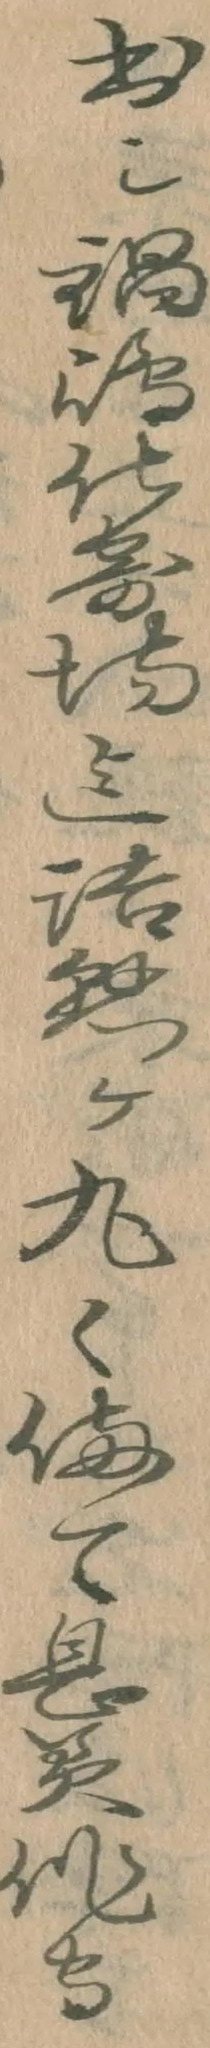出し鍋島仕寄場迄詰懸け丸く備て息美作守
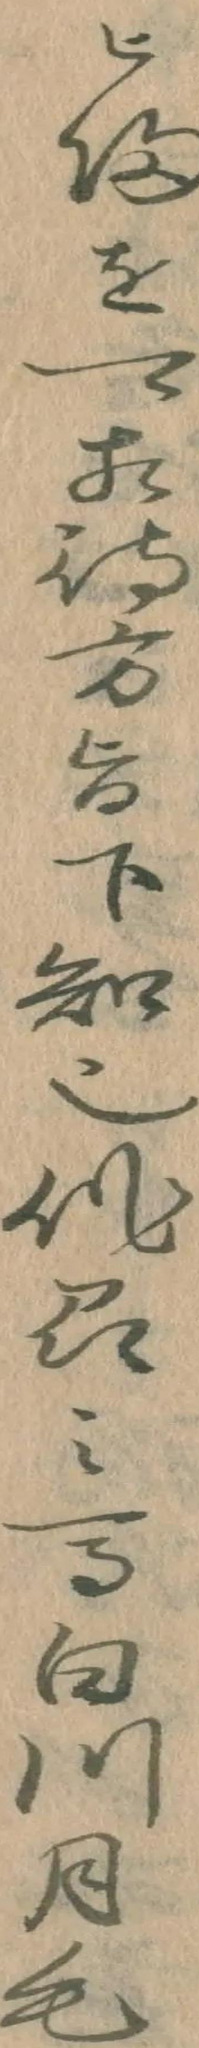被帰を可相待方旨下知也作州之馬白川月毛
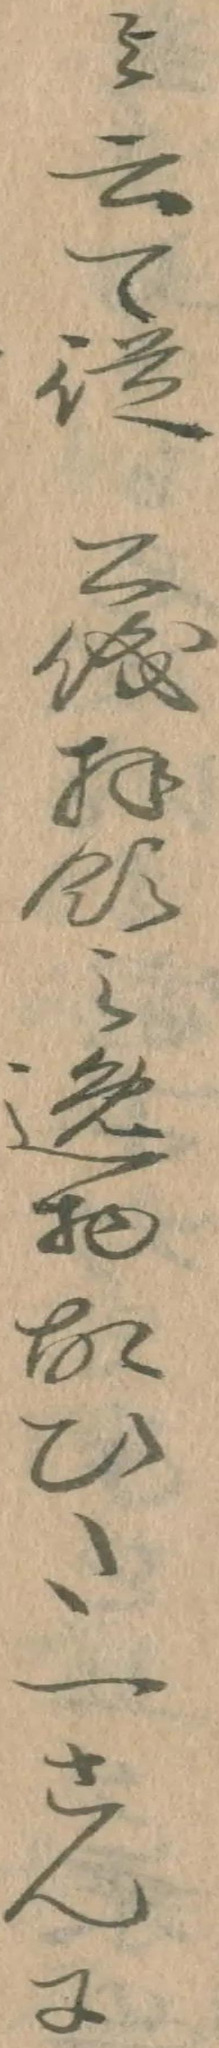与云て従公儀拝領之逸物故ひた一さん尓
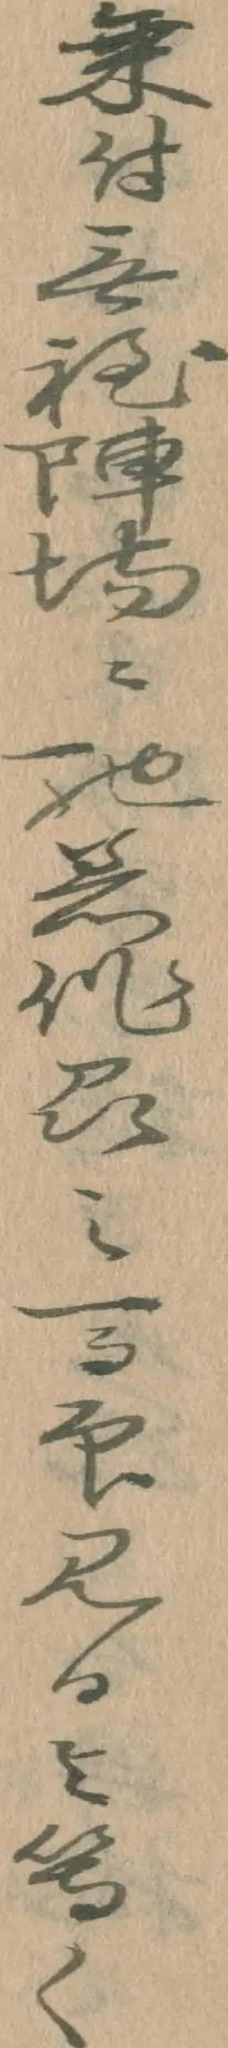乗付無程陣場に馳着作州之馬印見る与等く
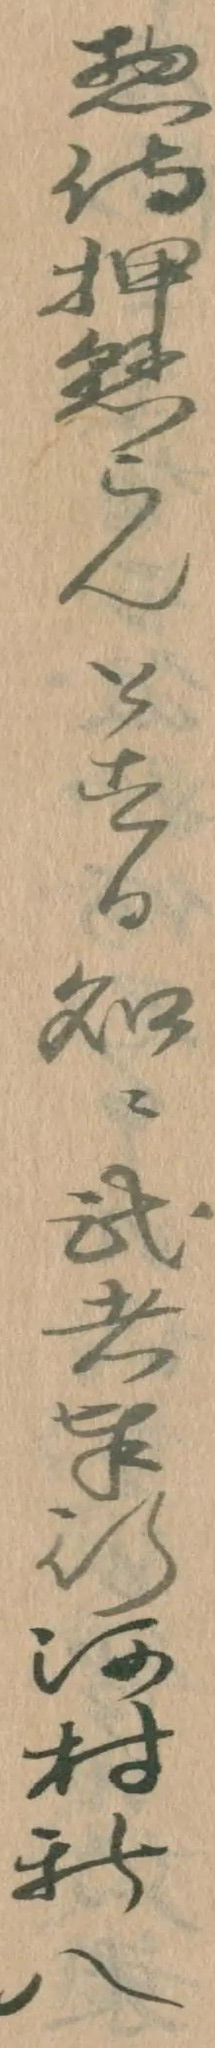惣侍押懸らんと春る処に武者奉行河村新八
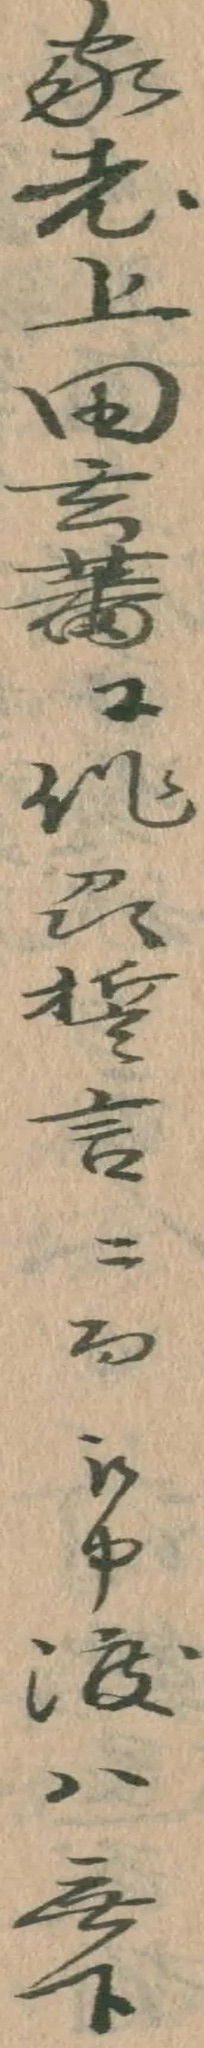家老上田玄蕃尓作州誓言に而被申渡は無下
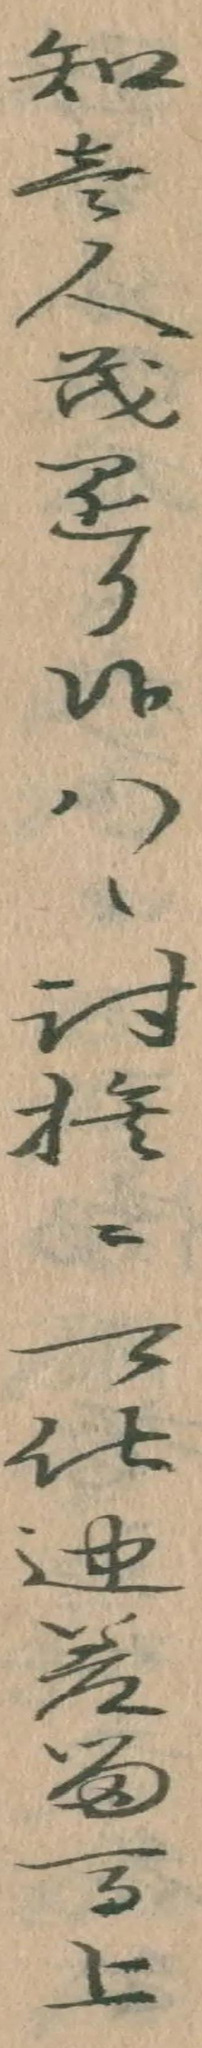知壱人茂懸り候はゝ打捨に可仕迚差留馬上
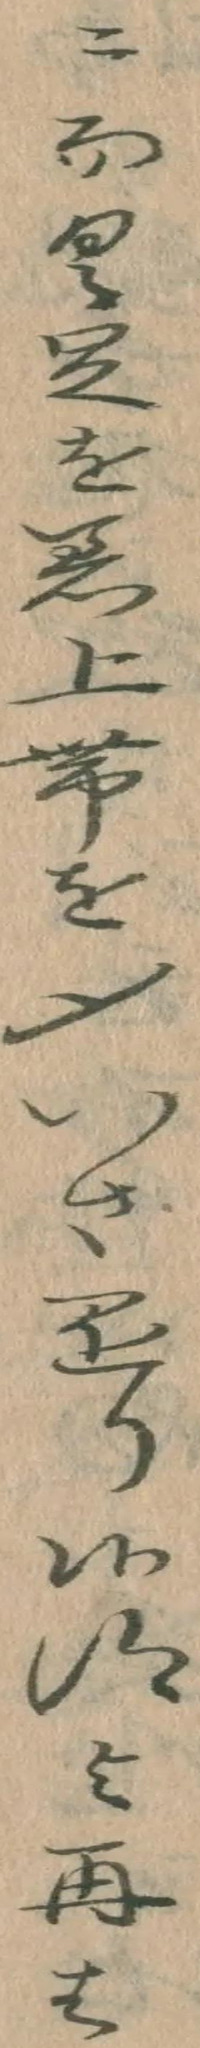に而具足を差上帯を〆いさ懸り候得与再者
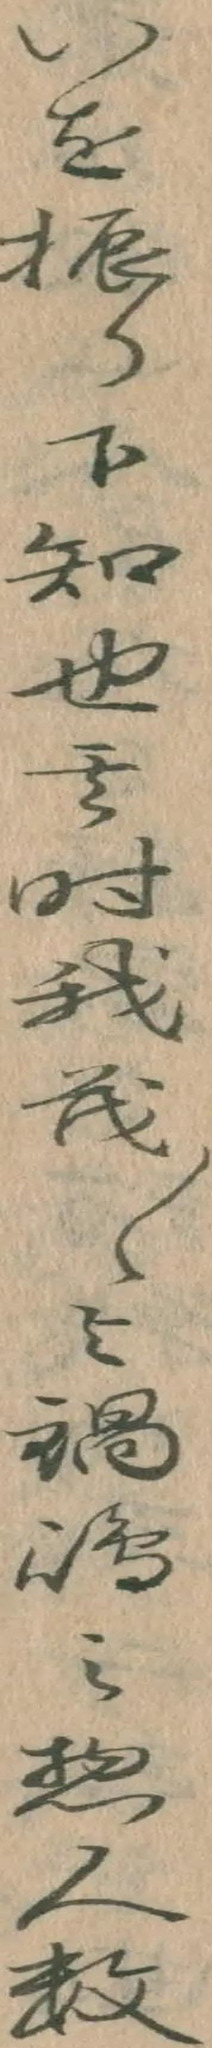いを振り下知也其時我茂〱与鍋島之惣人数
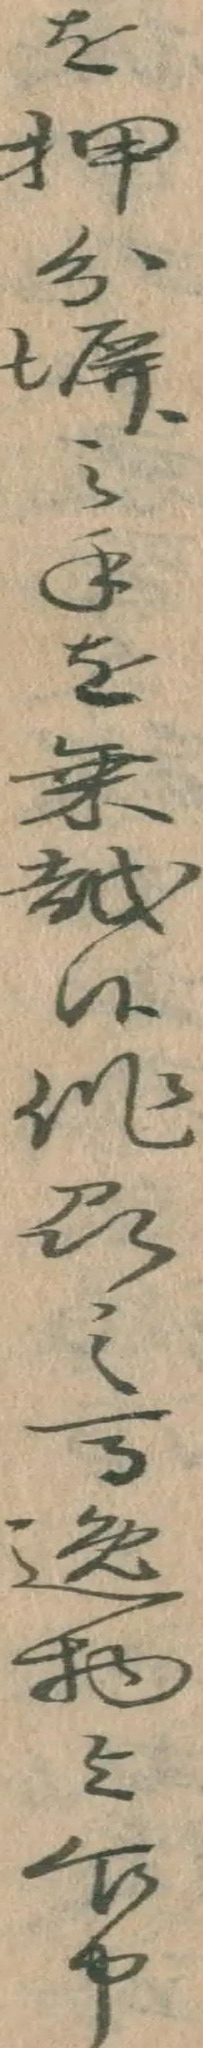を押分塀之手を乗越候作州之馬逸物与乍申
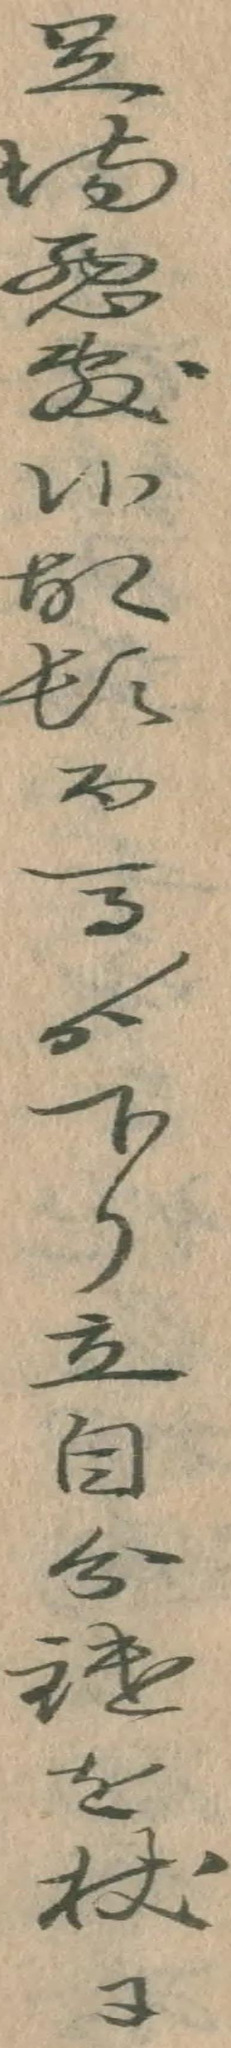足場悪敷候故頓而馬ゟ下り立自分鑓を杖尓
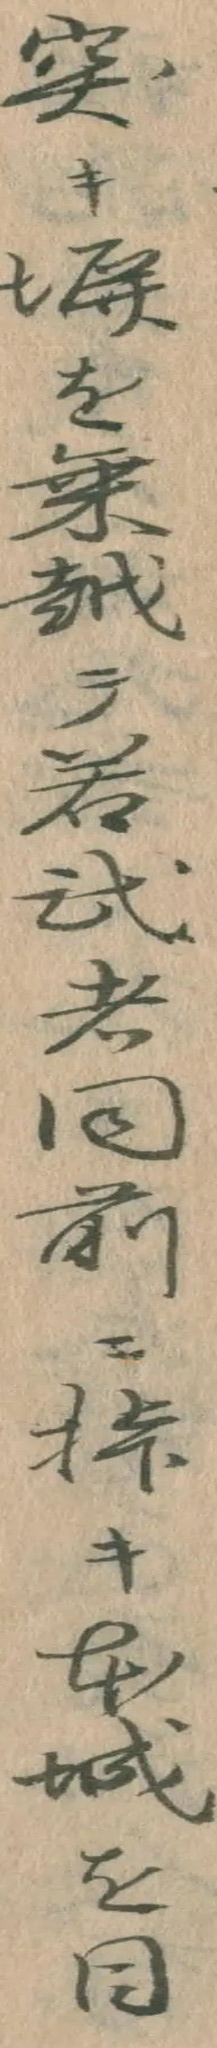突き塀を乗越て若武者同前に挊き本城を目
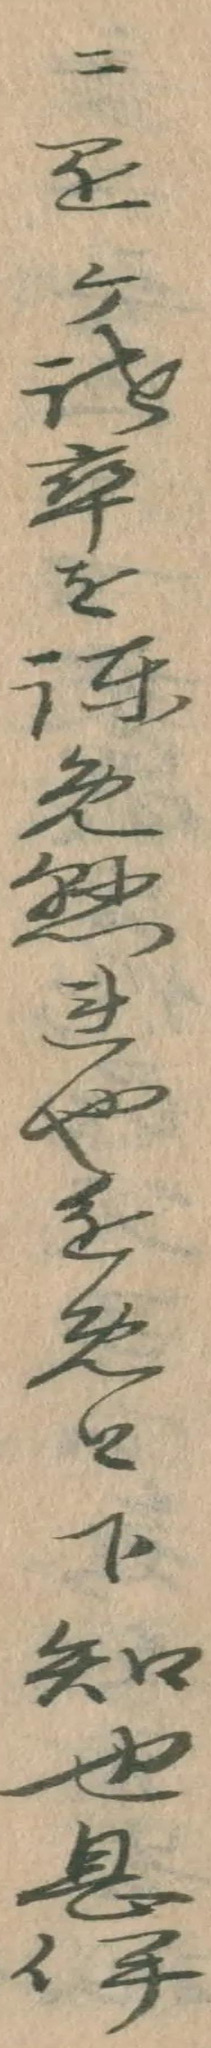に懸け諸卒を評免懸連や進免と下知也息伊
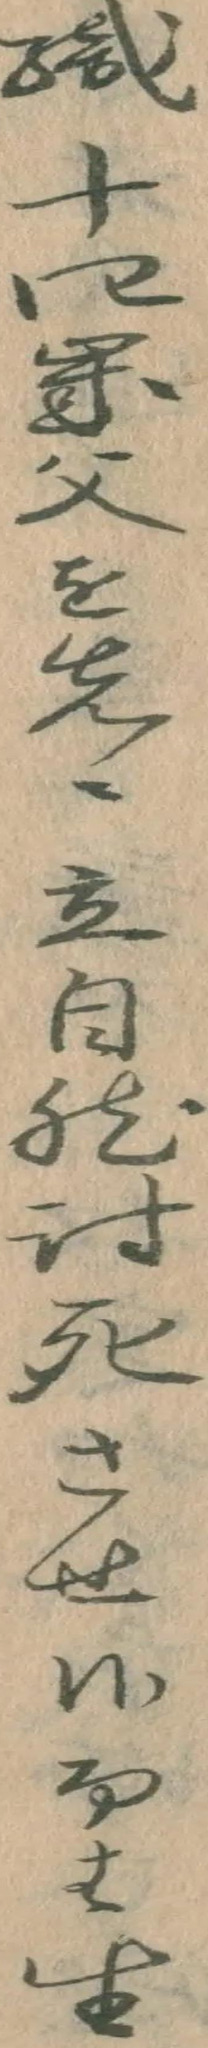織十四歳父を先に立自然討死させ候而者生
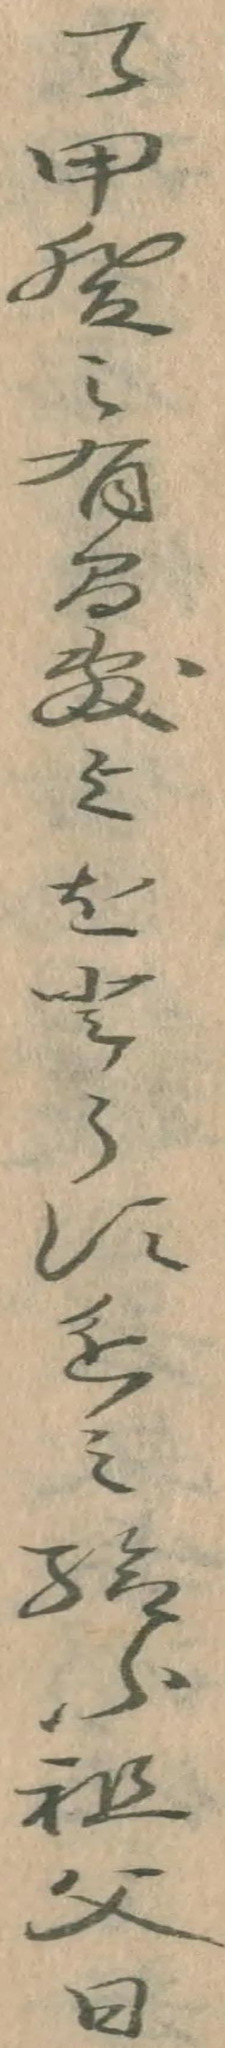て甲斐之有間敷与を登ら須進之給ふ祖父日
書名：切支丹御退治記 49巻. [7]
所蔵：国立国会図書館 National Diet Library, JAPAN
